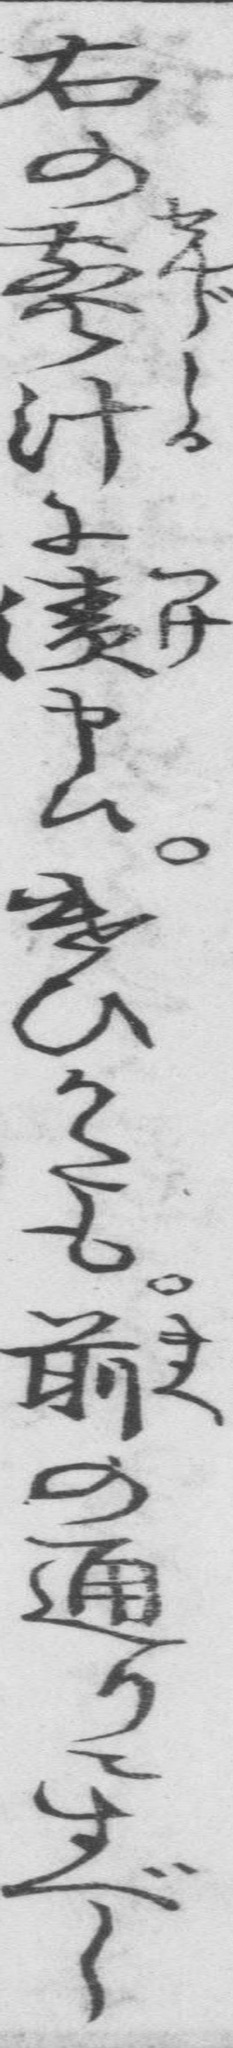右の煎汁に漬申候。遣ひかたも。前の通りにすべし
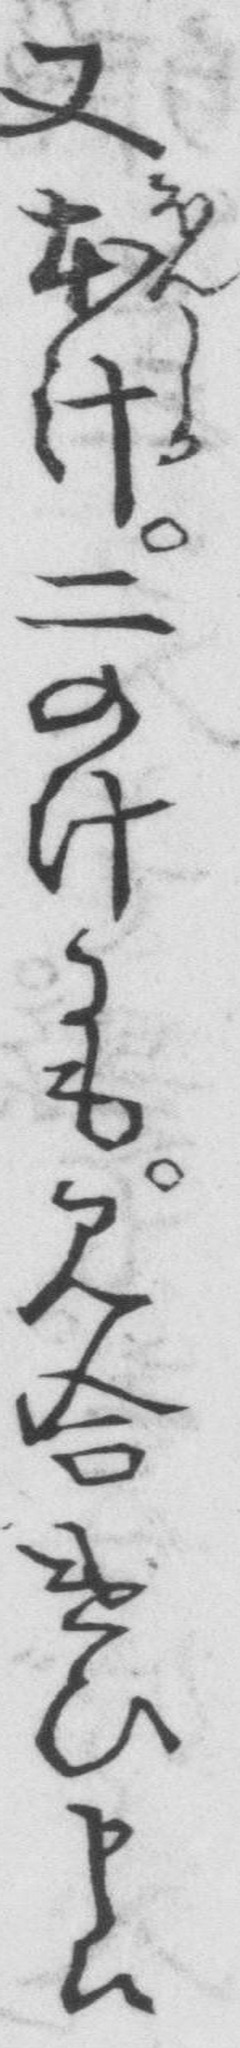又本汁。二の汁にも。見合遣ひ申候
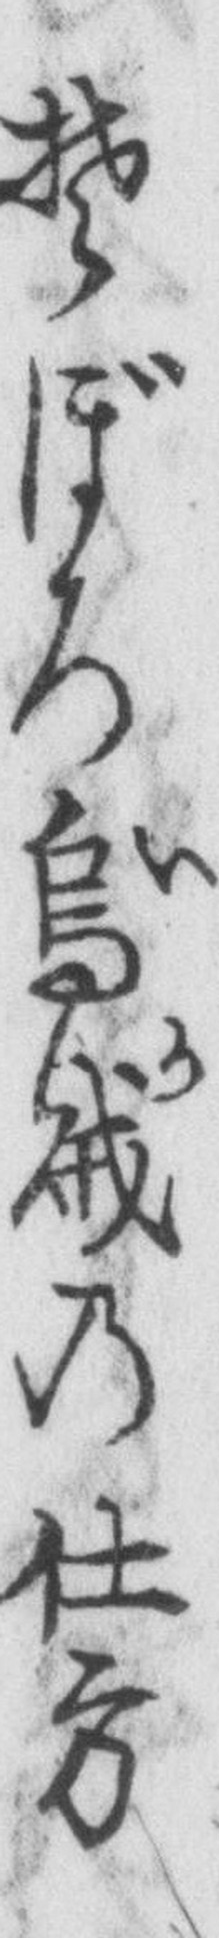そぼろ烏賊の仕方
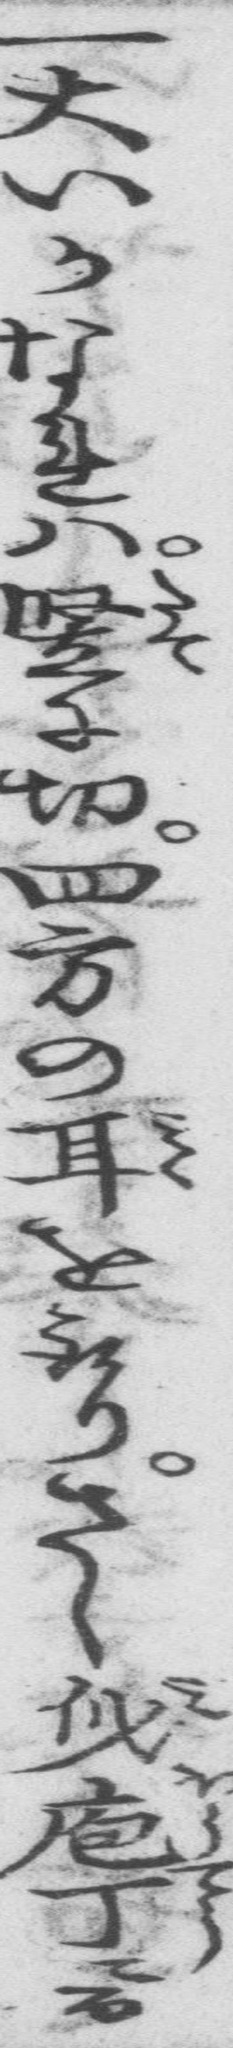一大いかなれは。竪に切。四方の耳を取り。さし身包丁に而
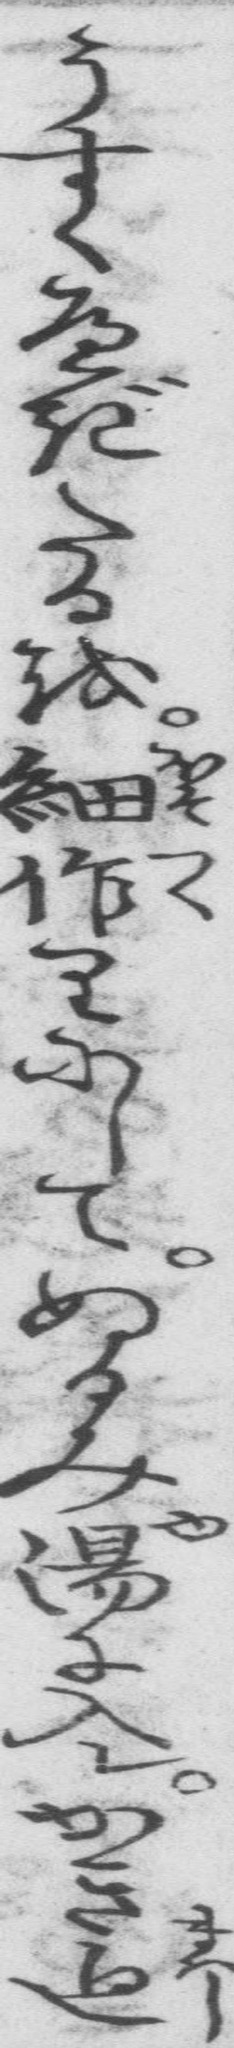うすくへぎたるを。細作りにして。ぬるみ湯に入れ。かき廻
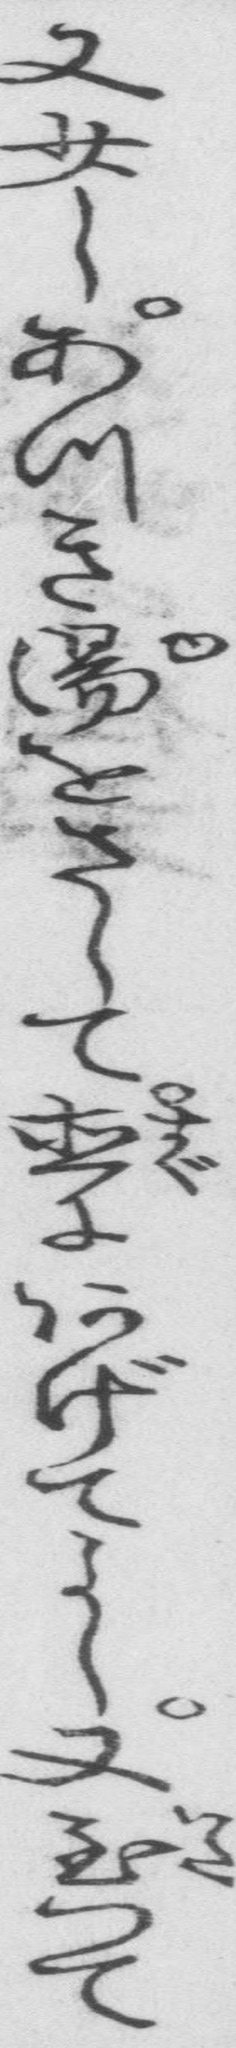又少し。あつき湯をさして。直にあげてよし。又至つて
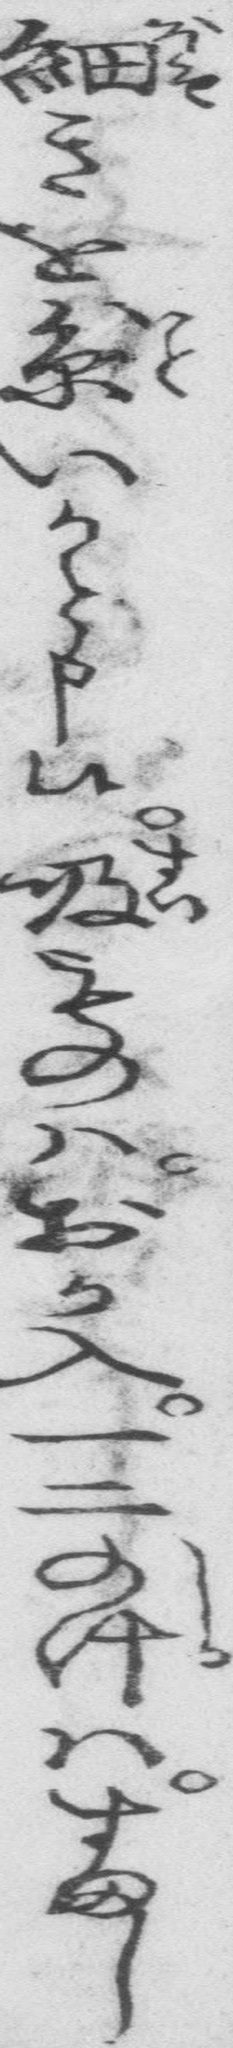細きを糸いかと申候。吸ものは。おか入。一二の汁は。すまし
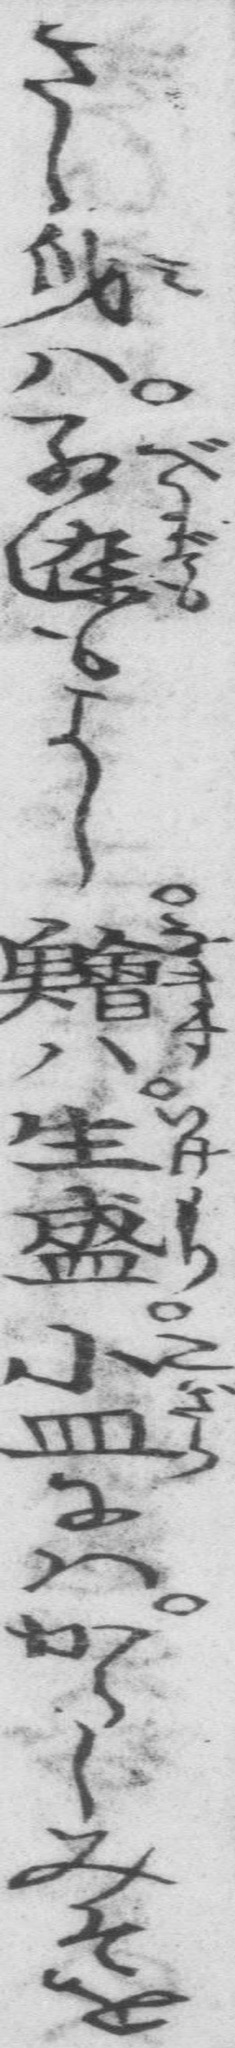さし身は。紅染もよし。鱠は。生盛。小皿には。からしみそを
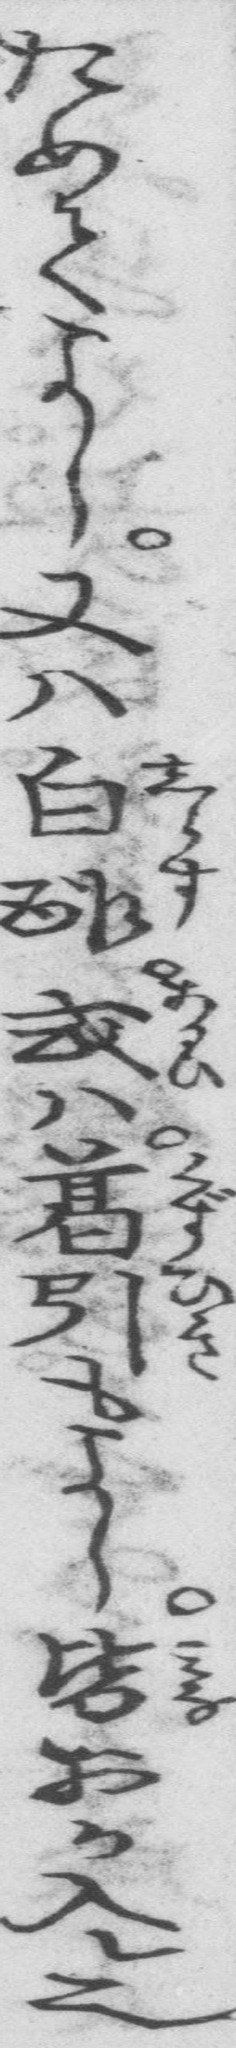ためてよし。又は白酢。或は。葛引もよし。皆おか入れ也
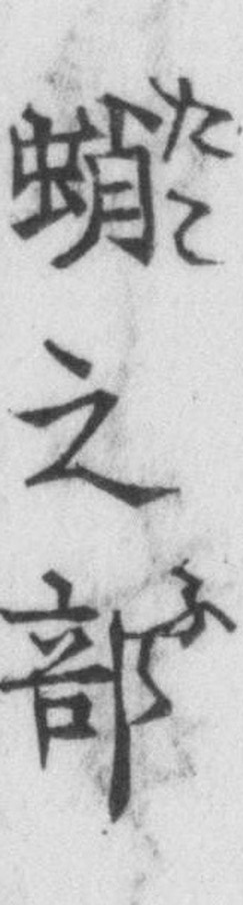蛸の部
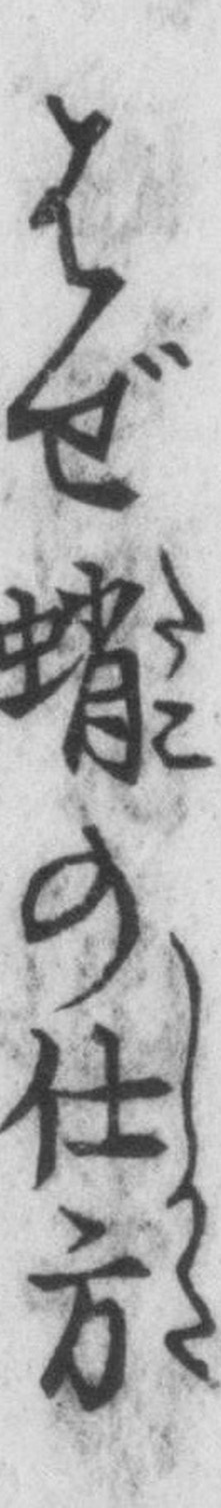はぜ蛸の仕方

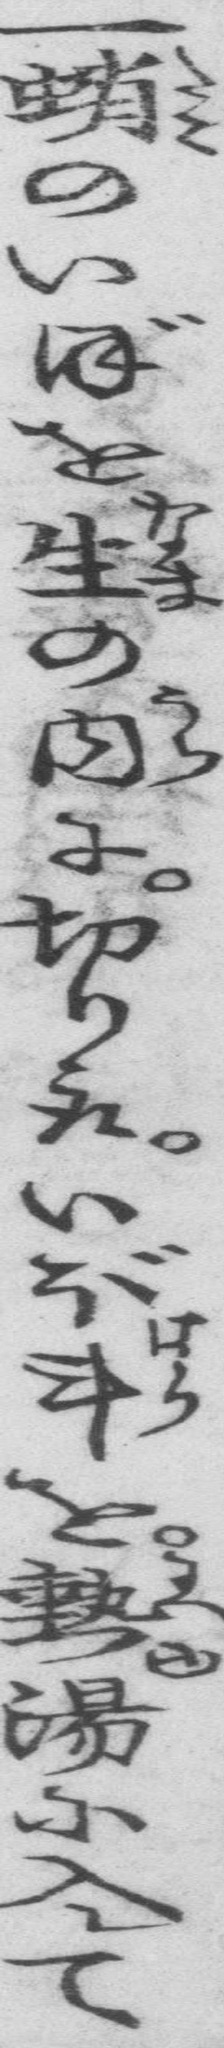一蛸のいぼを生の内に。切り取。いぼ斗を。熱湯に入れて
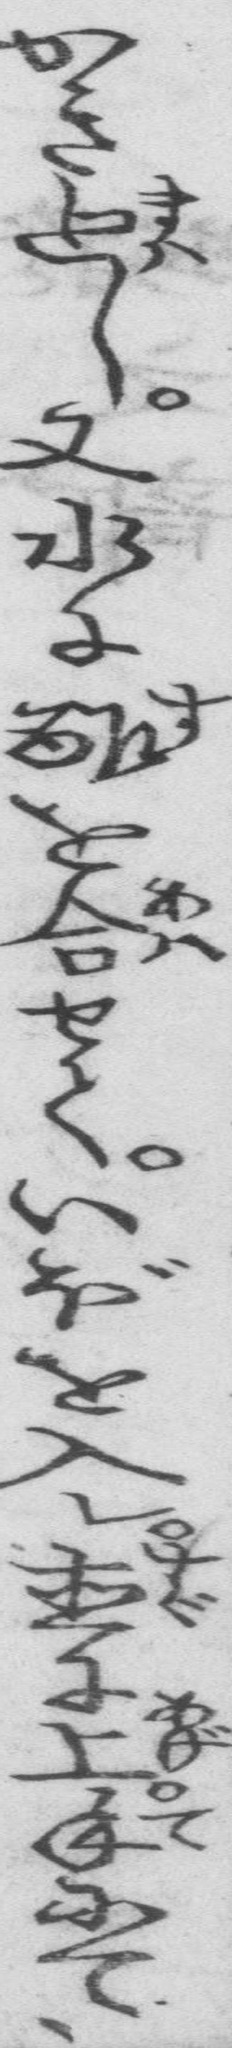かき廻し。又水に酢を合せて。いぼを入れ。直に上。手にて
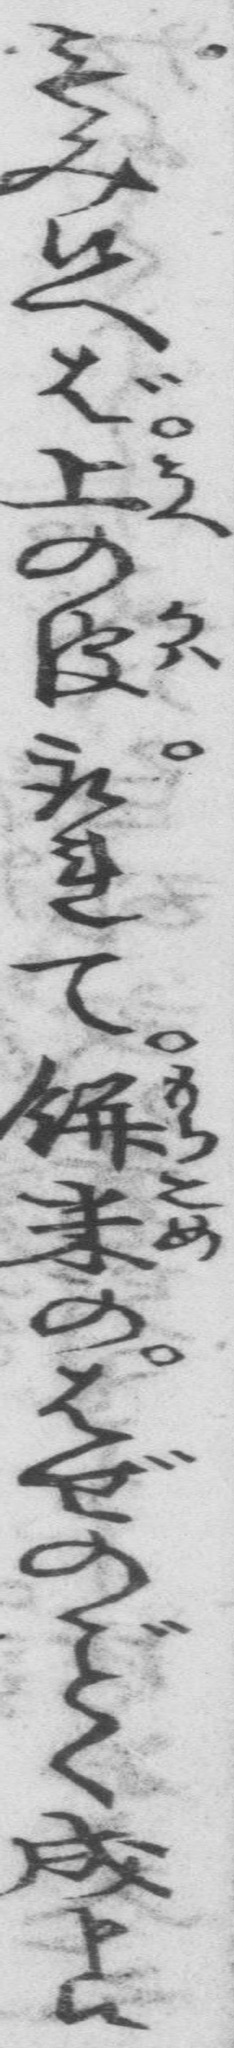もみ候へば。上の皮。取れて。餅米の。はぜのごとく成申候
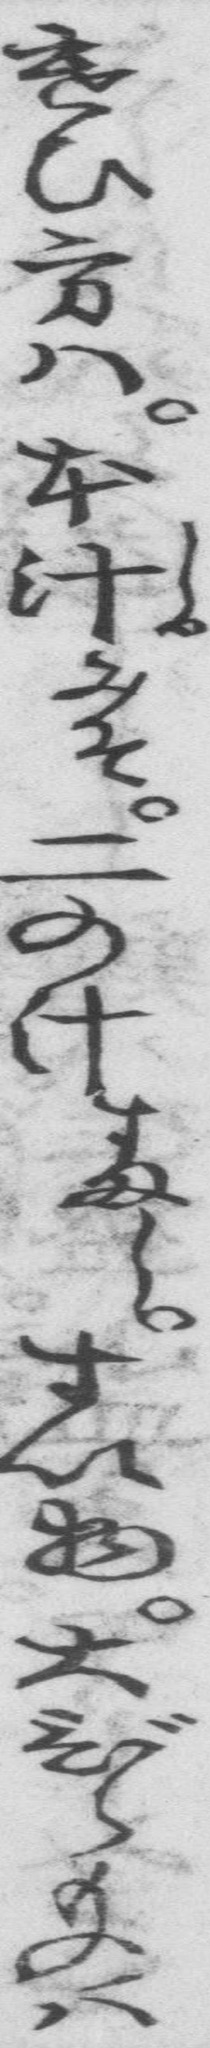遣ひ方は。本汁みそ。二の汁すまし。すい物。大びらものは
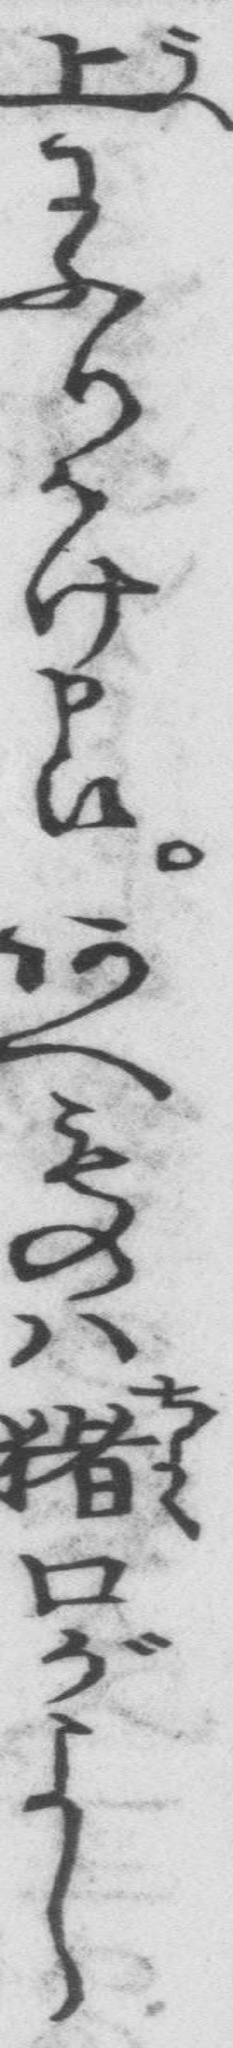上にふりかけ申候。あへものは猪口がよし
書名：萬寳料理秘密箱
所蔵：大阪府立大学学術情報センター 国文学研究資料館
